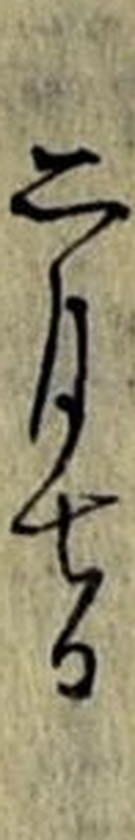二月七日
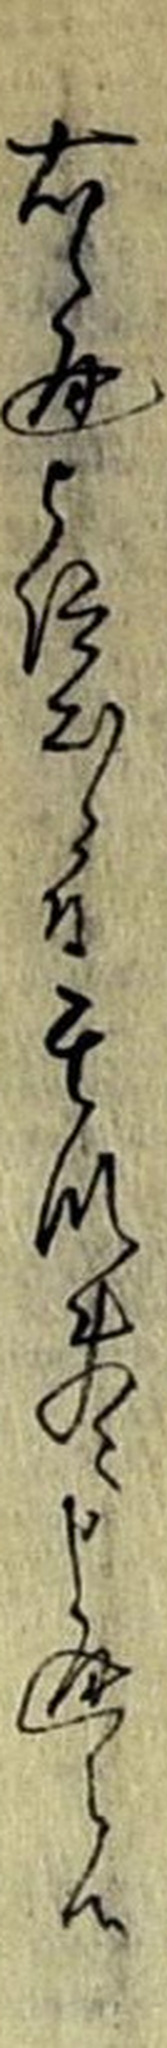右之通被仰出候に付其段夫々申通し候
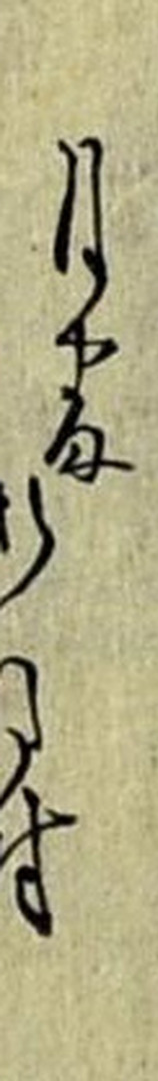月番御目付
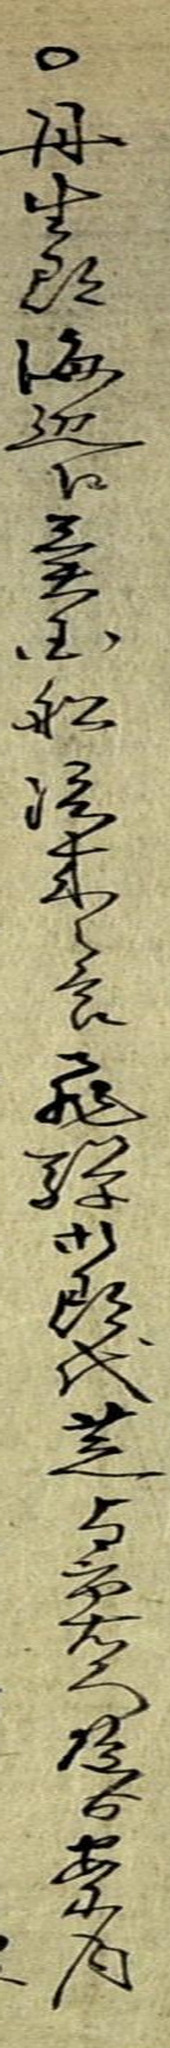○丹生郡海辺江異国船渡来候節飛驒御郡代芝与市右衛門殿ゟ案内
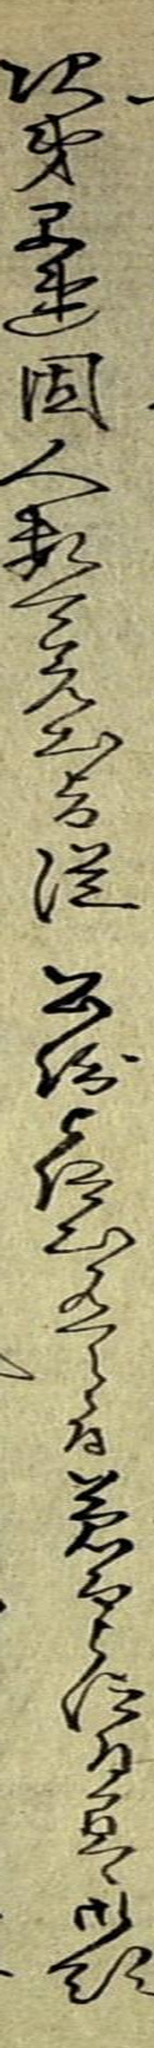次第早速固人数可差出旨従公儀被仰出有之候に付兼而被仰付置候御領
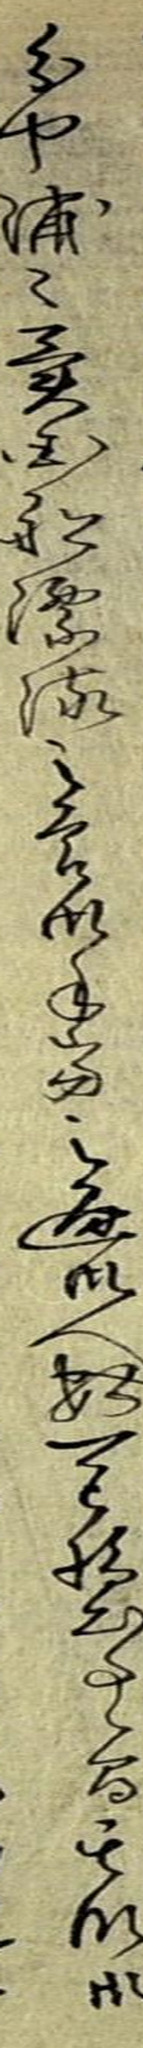分中浦々異国船漂流之節御手当之通御人数可被指出事候間其段御
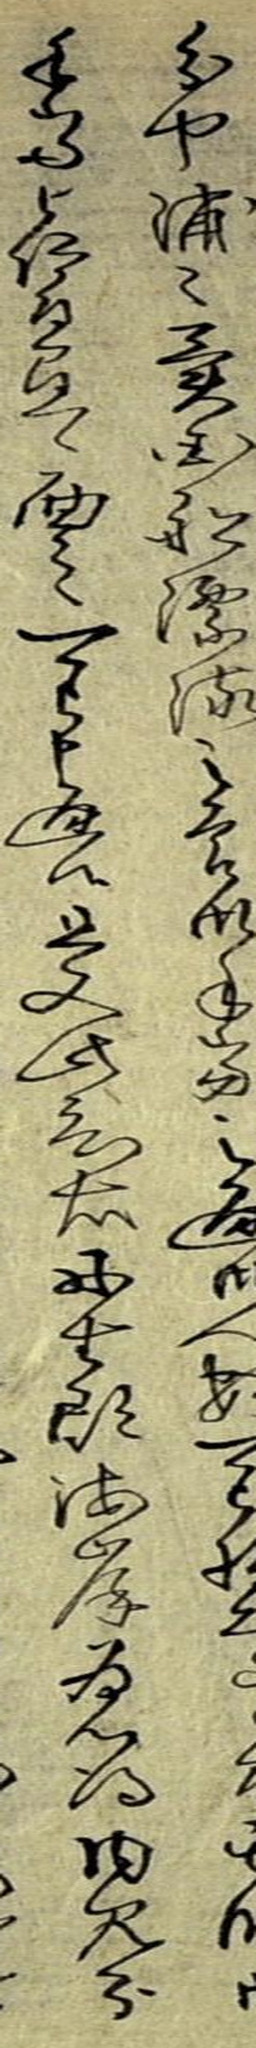手当被仰付置候面々へ可被申通候且又此度右丹生郡海岸為心得内見分
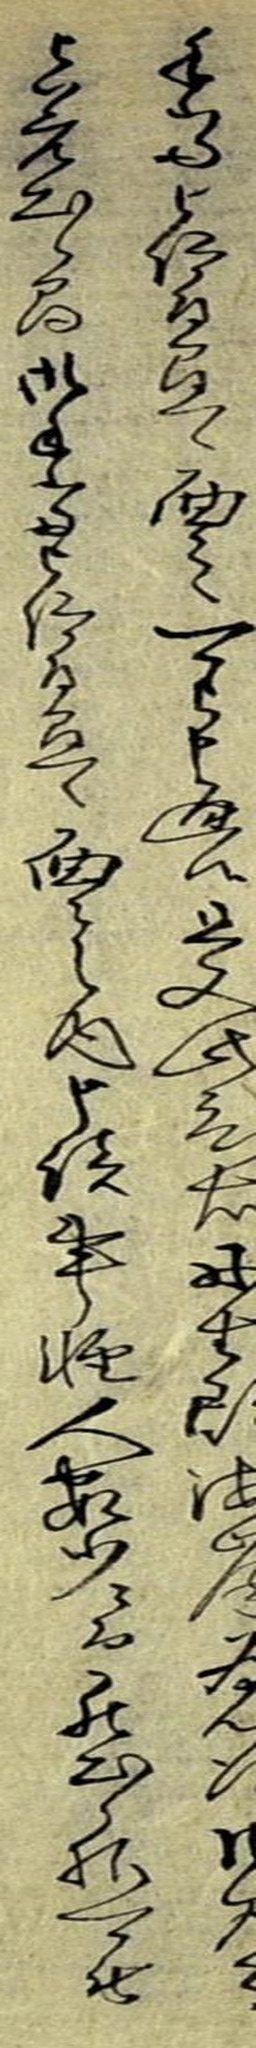被差出候間御手当被仰付置候面々之内申談事軽人数少に而罷出候様可被
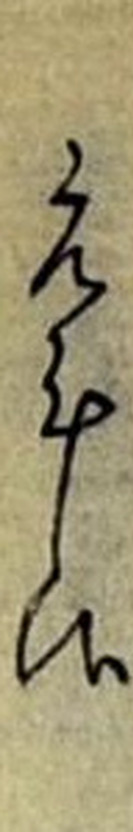取斗候
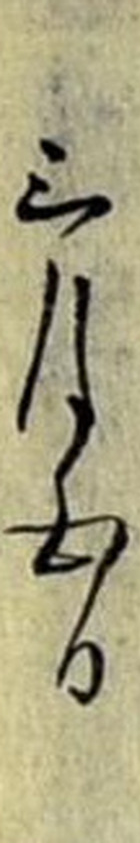三月五日
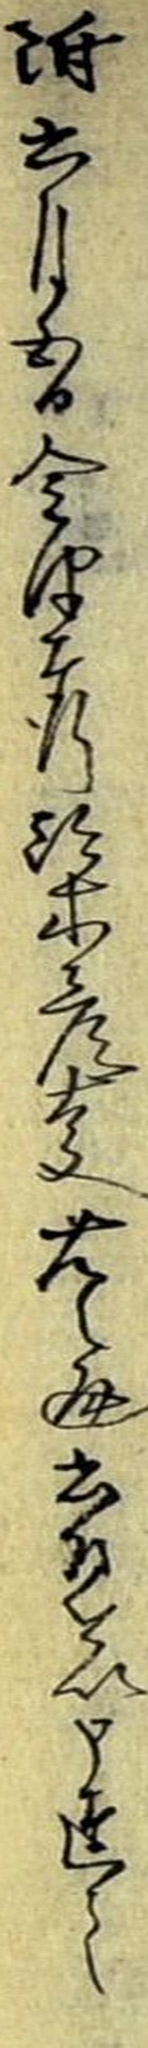附六月五日金津奉行鈴木彦太夫左之通書付を以申達之

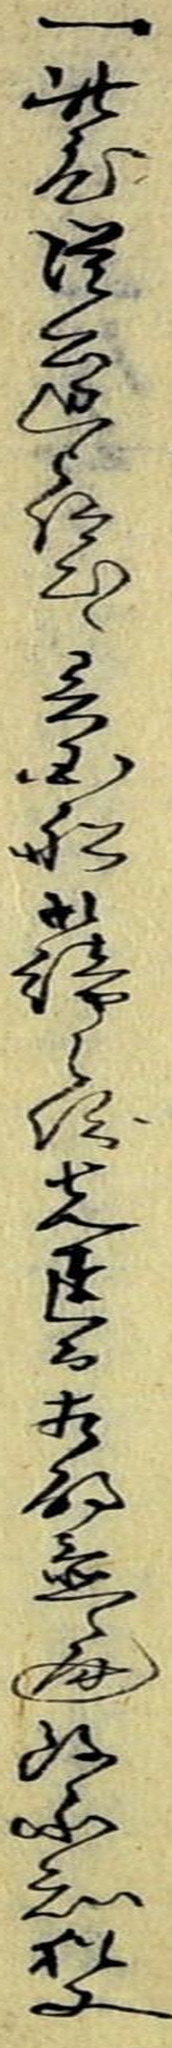一此度従公辺被仰出候異国船御締之儀先達而相触置候通致承知猶又
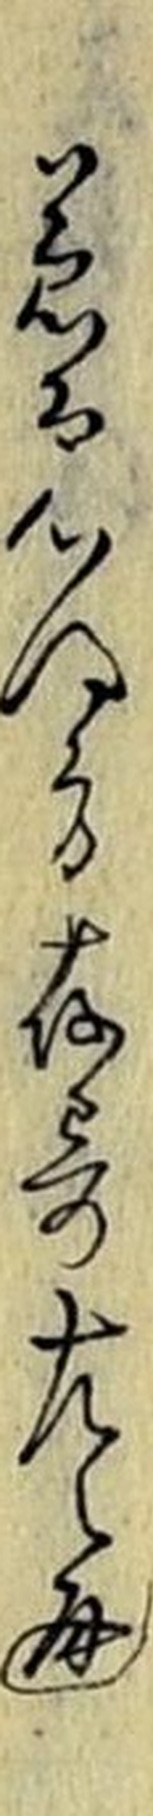兼而心得方存寄左之通
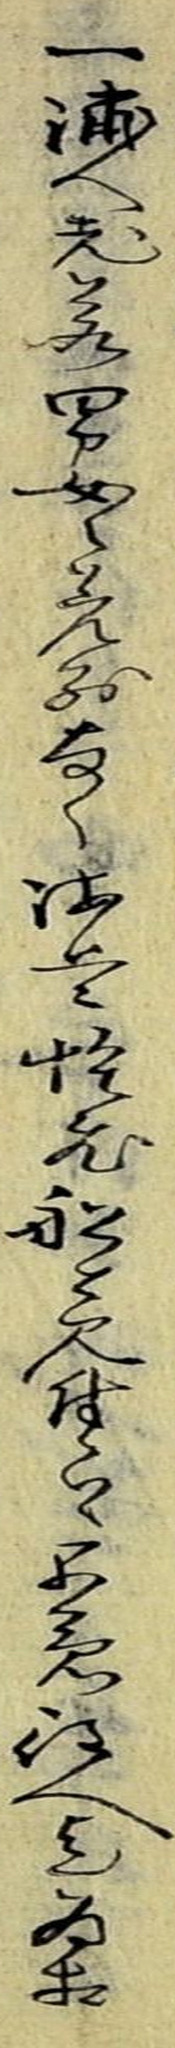一浦人老若男女之差別なく海上に怪敷船を見付候はヽ早急役人迄為相
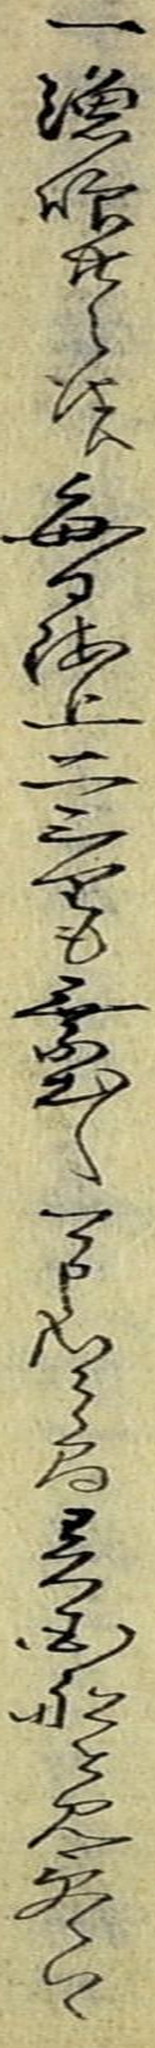一漁師共之儀は毎日海上二三里も乗出し可申哉に候間異国船を見受候はヽ
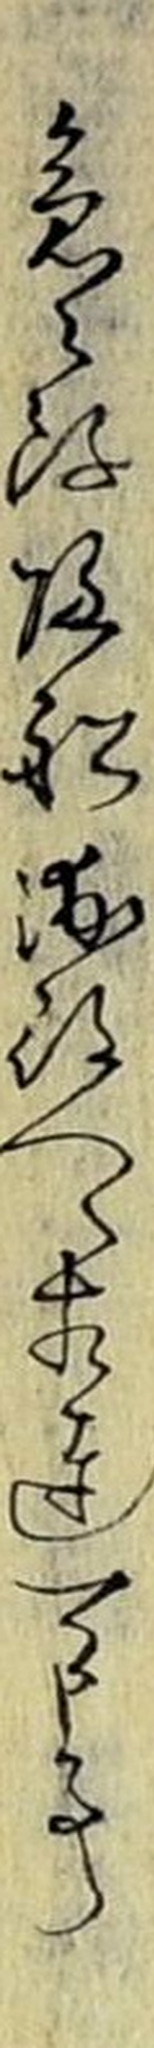急々致帰船浦役人へ相達可申事
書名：命令之部 四
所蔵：福井県文書館 Fukui Prefectural Archives
